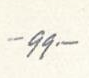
99
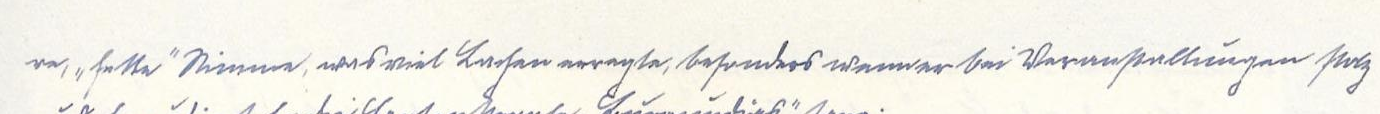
re, „fette" Stimme, was viel Lachen erregte, besonders wenn er bei Veranstaltungen stolz
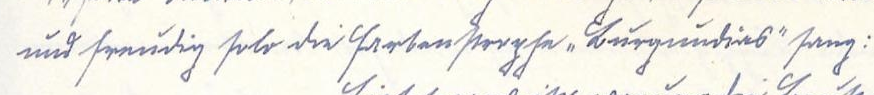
und freudig solo die Farbenstrophe "Burgundias" sang:
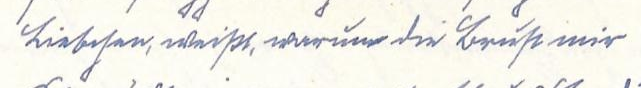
Liebchen, weißt, warum die Brust mir
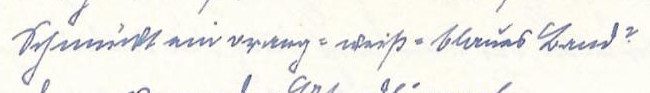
Schmückt ein orang-weiß-blaues Band?
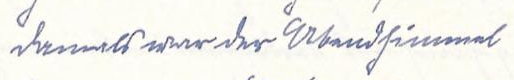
Damals war der Abendhimmel
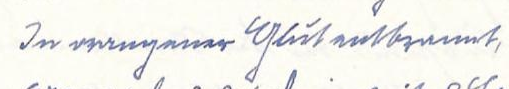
In orangener Glut entbrannt,
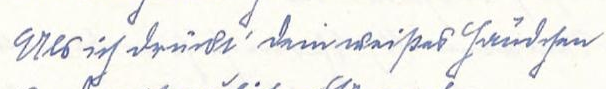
Als ich drückt' Dein weißes Händchen
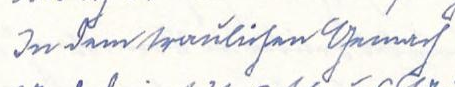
In dem traulichen Gemach
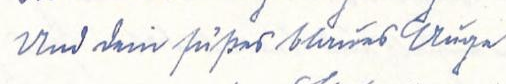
Und dein süßes blaues Auge
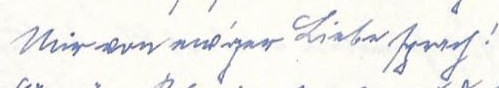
Mir von ewiger Liebe sprach!-
